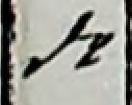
do
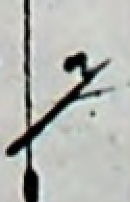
7
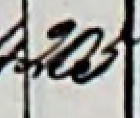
205
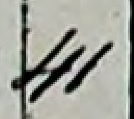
41
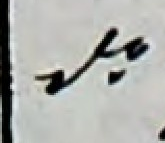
do
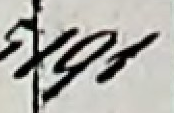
191
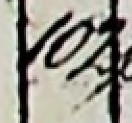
102
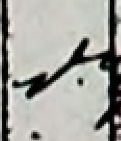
do
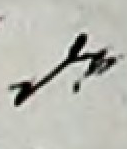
do
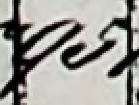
95
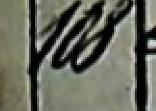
108
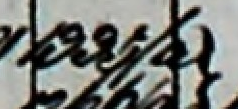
1335/a
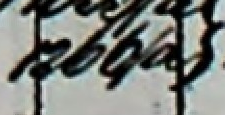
1266/a
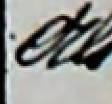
Alt
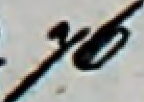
76
